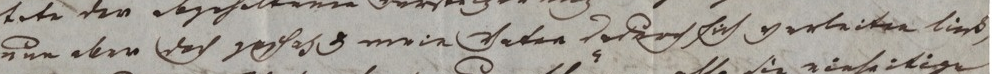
nun aber doch geschah & mein Vater dadurch sich verleiten ließ,
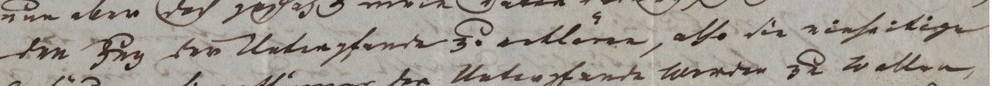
den Zug der Unterpfande zu erklären, also die einseitige
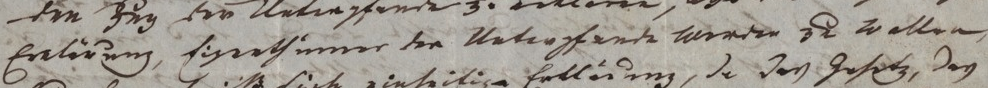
Erklärung, Eigenthümer der Unterpfande werden zu wollen,
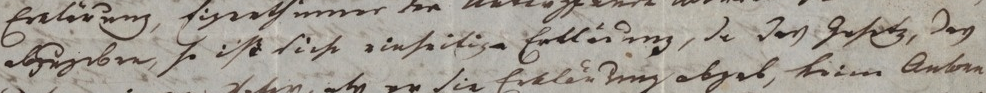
abzugeben, so ist diese einseitige Erklärung, da das Gesetz, das
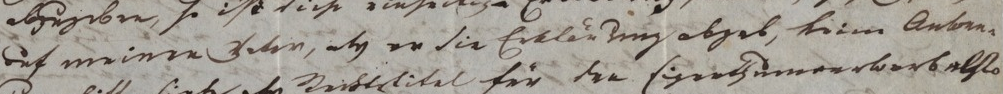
auf meinen Vater, als er die Erklärung abgab, keine Anwen-
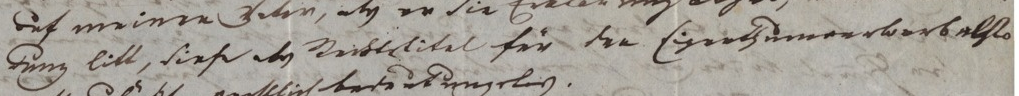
dung litt, diese als Rechtstitel für den Eigenthumserwerb also
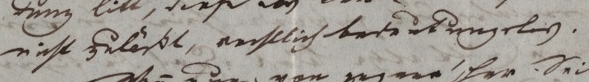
nicht zuläßt, rechtlich bedeutungslos.
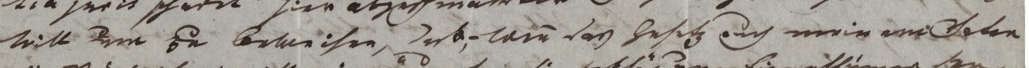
will um zu beweisen, daß, – wenn das Gesetz auch meinem Vater
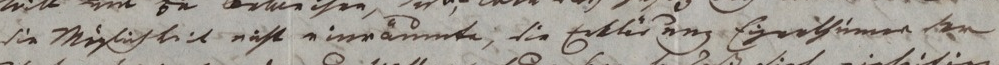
die Möglichkeit nicht einräumte, die Erklärung Eigenthümer der
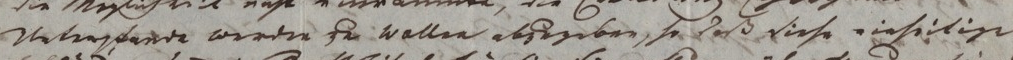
Unterpfande werden zu wollen abzugeben, so daß diese einseitige
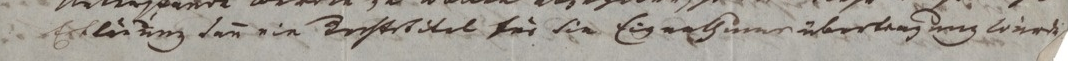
Erklärung dann ein Rechtstitel für die Eigenthümsübertragung würde
